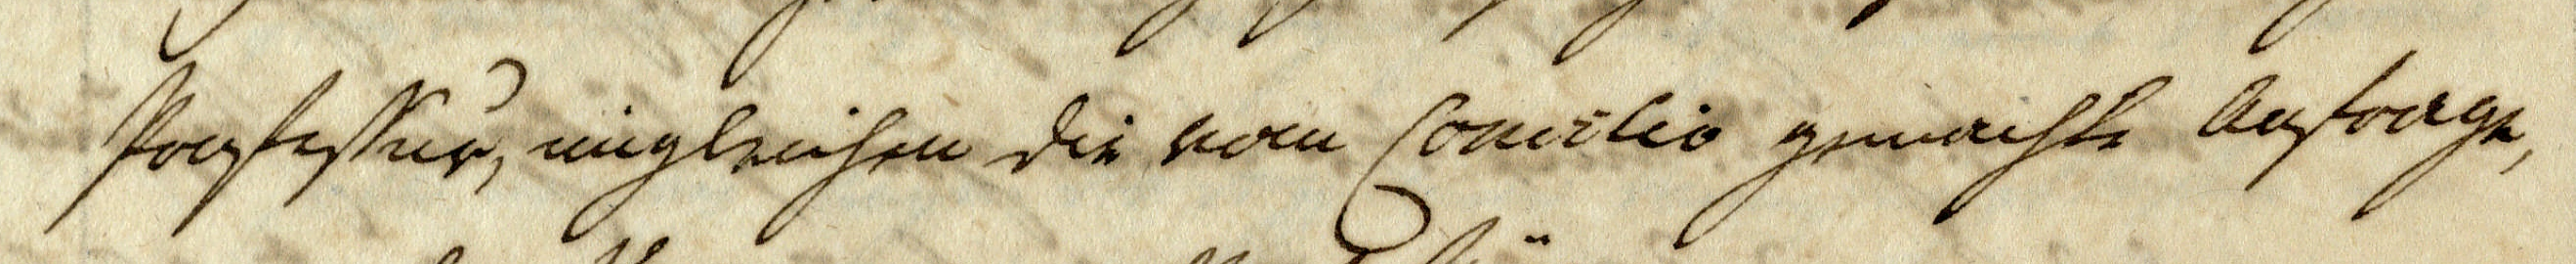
Professur, imgleichen die vom Concilio gemachte Anfrage,
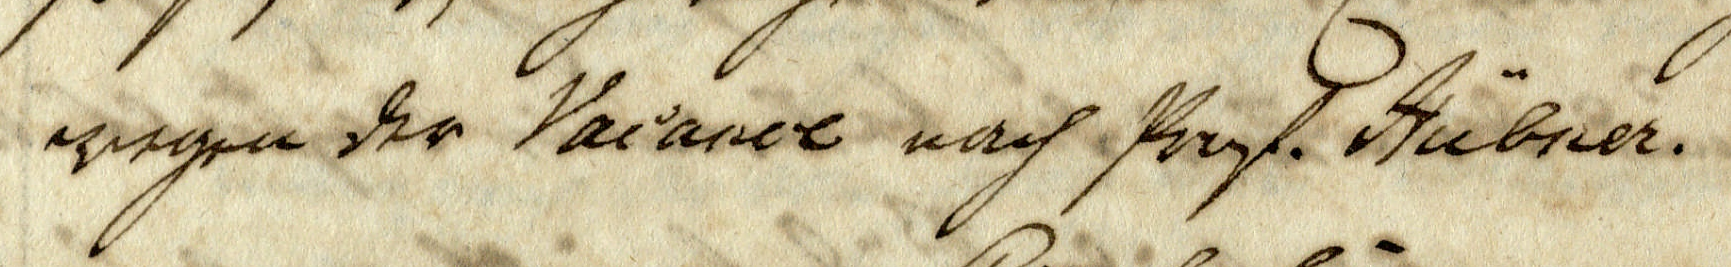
wegen der Vacance nach Prof. Hübner.
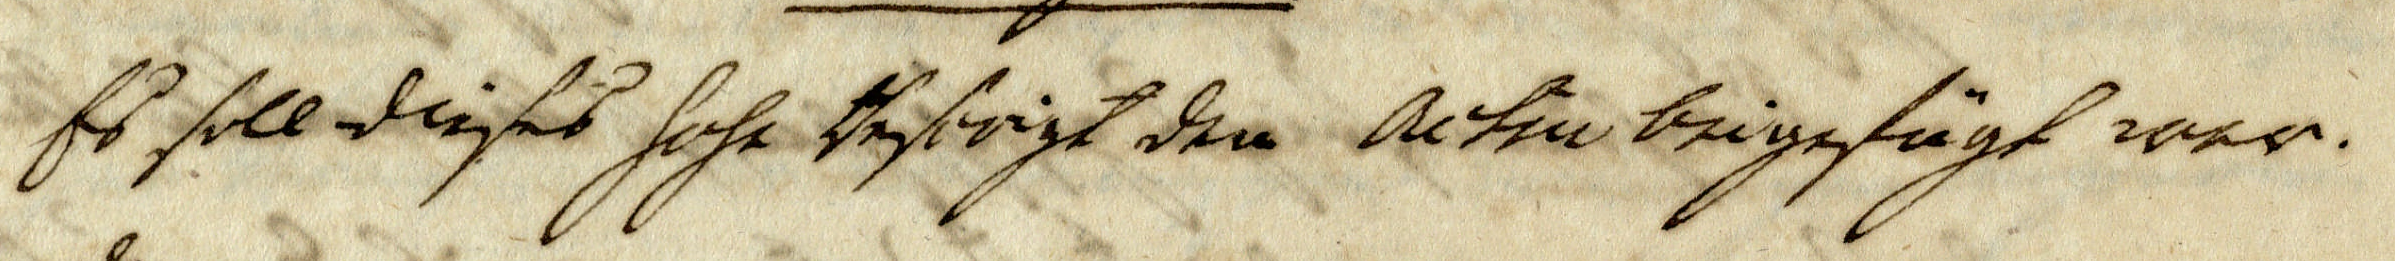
Es soll dieses hohe Rescript den Acten beigefügt wer¬
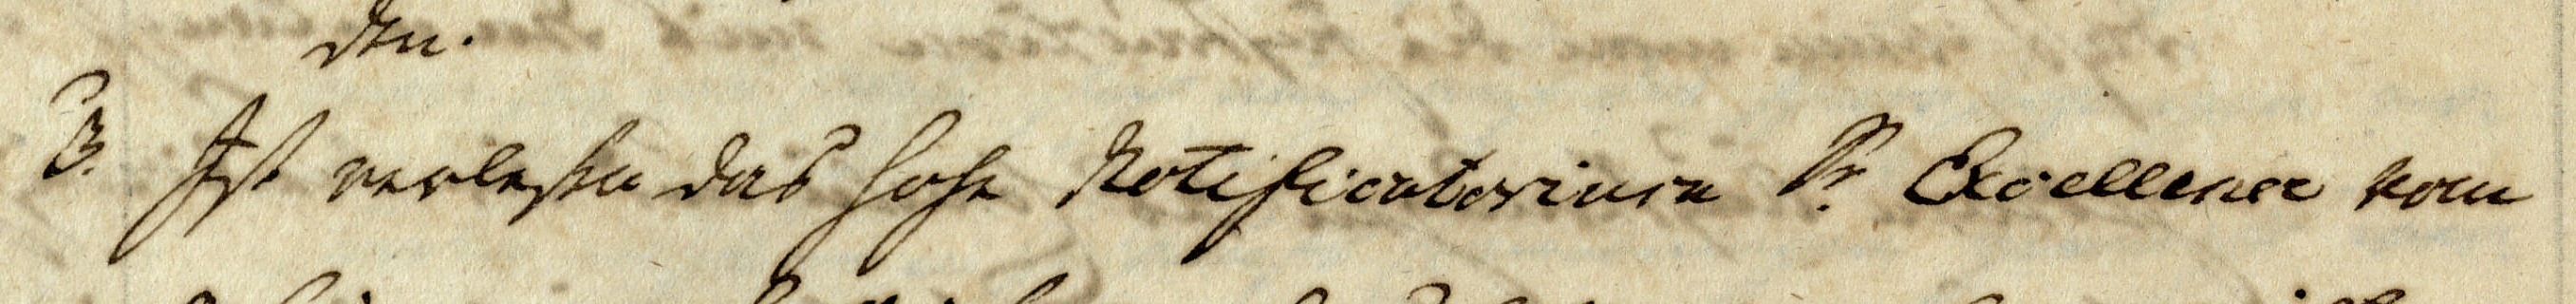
3. Ist verlesen das hohe Notificatorium Sr Excellence vom
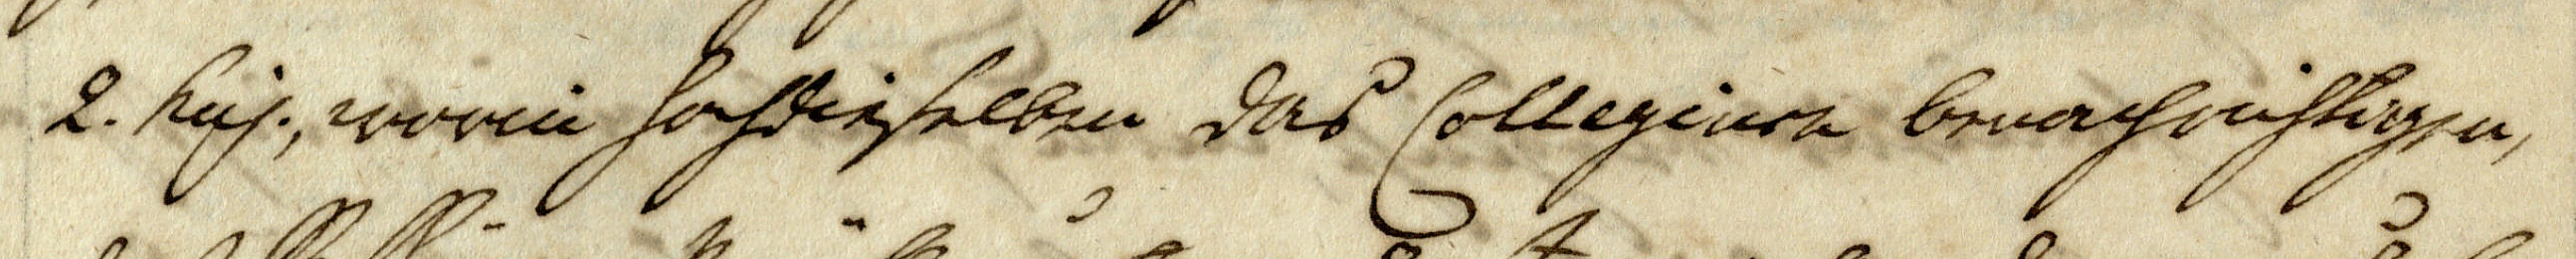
2. huj., worin Hochdieselben das Collegium benachrichtigen,
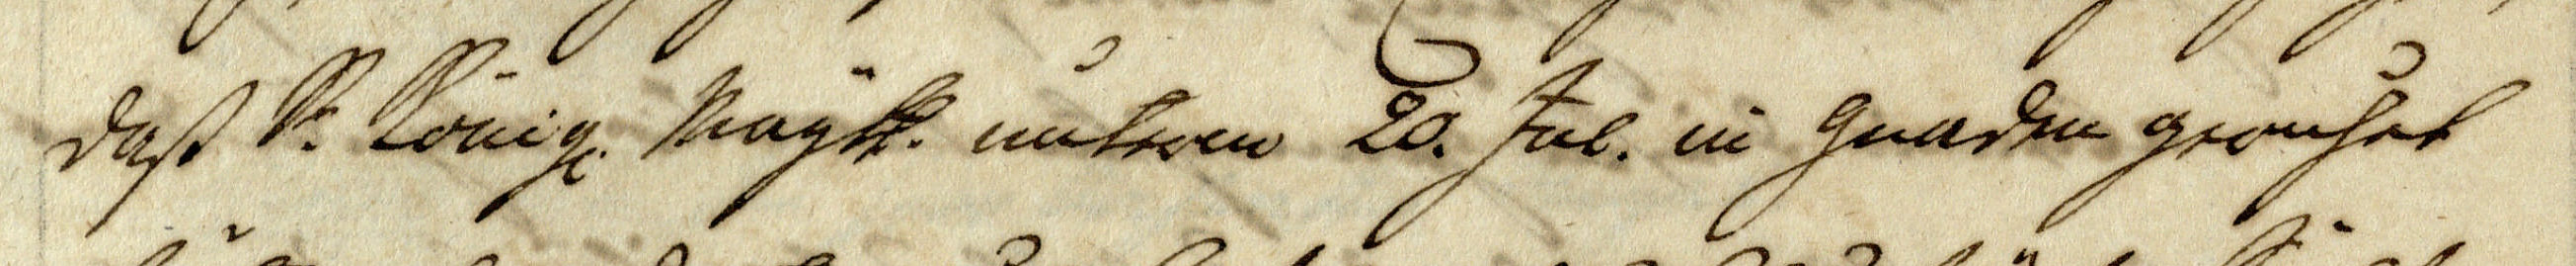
daß Sr. Königl Maÿtt. unterm 20. Jul. in Gnaden geruhet
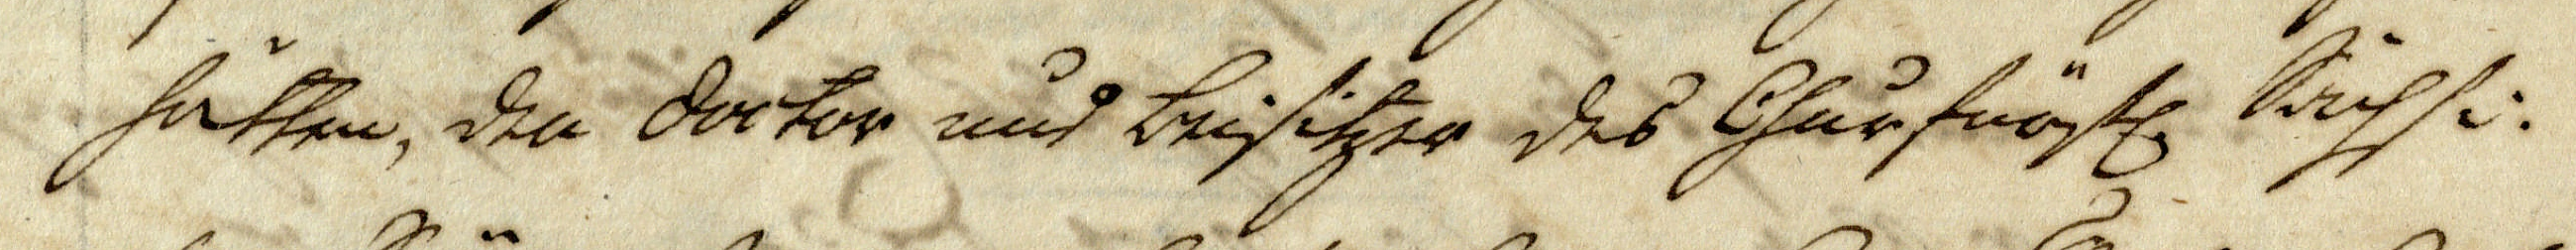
hätten, den Doctor und Beisitzer des Churfürstl Sächsi¬
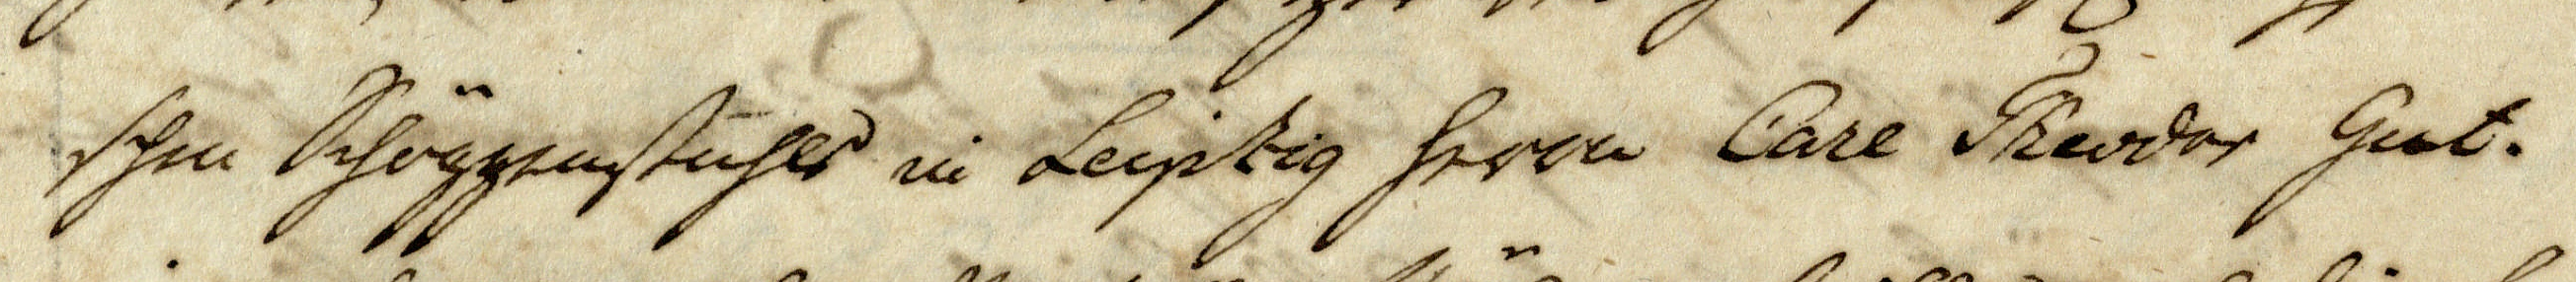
schen Schöppenstuhls in Leipzig Herrn Carl Theodor Gut¬
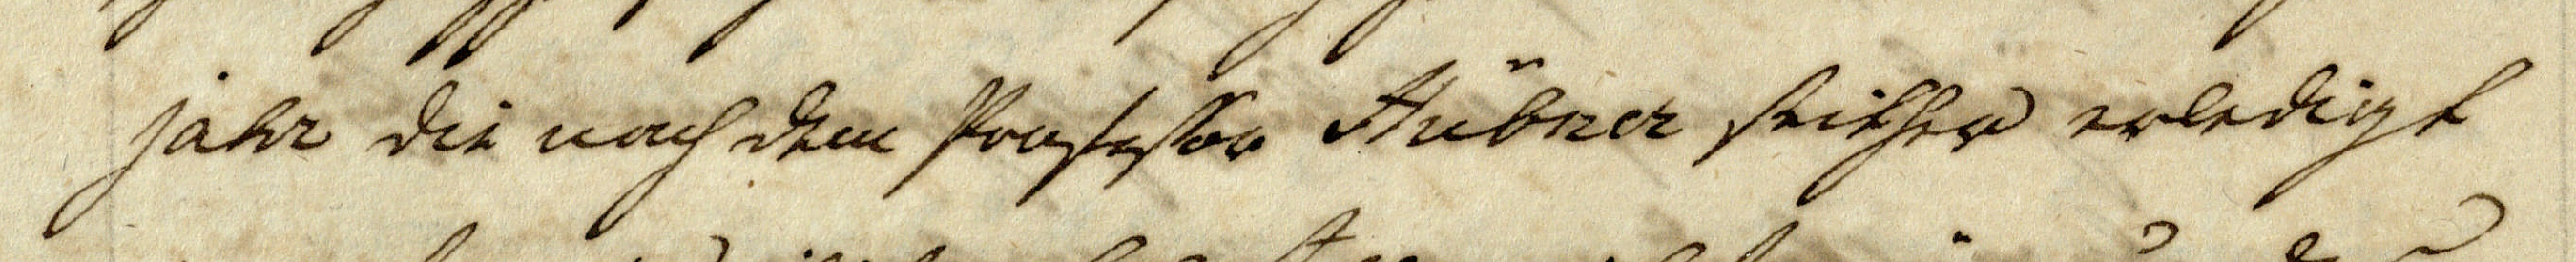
jahr die nach dem Professor Hübner seither erledigt
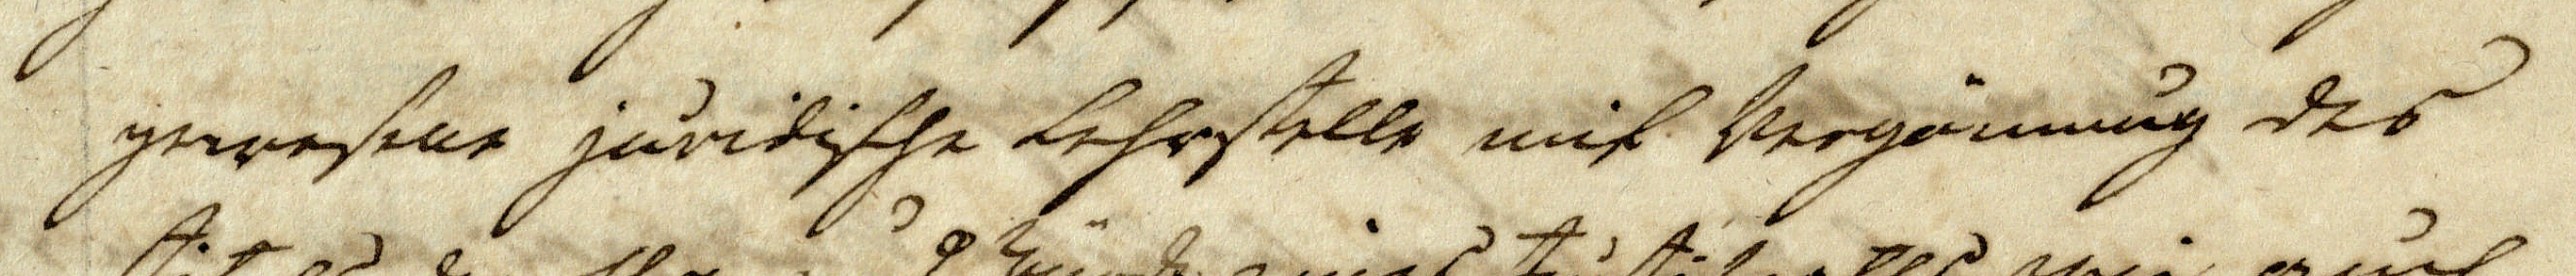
gewesene juridische Lehrstelle mit Vergönnung des
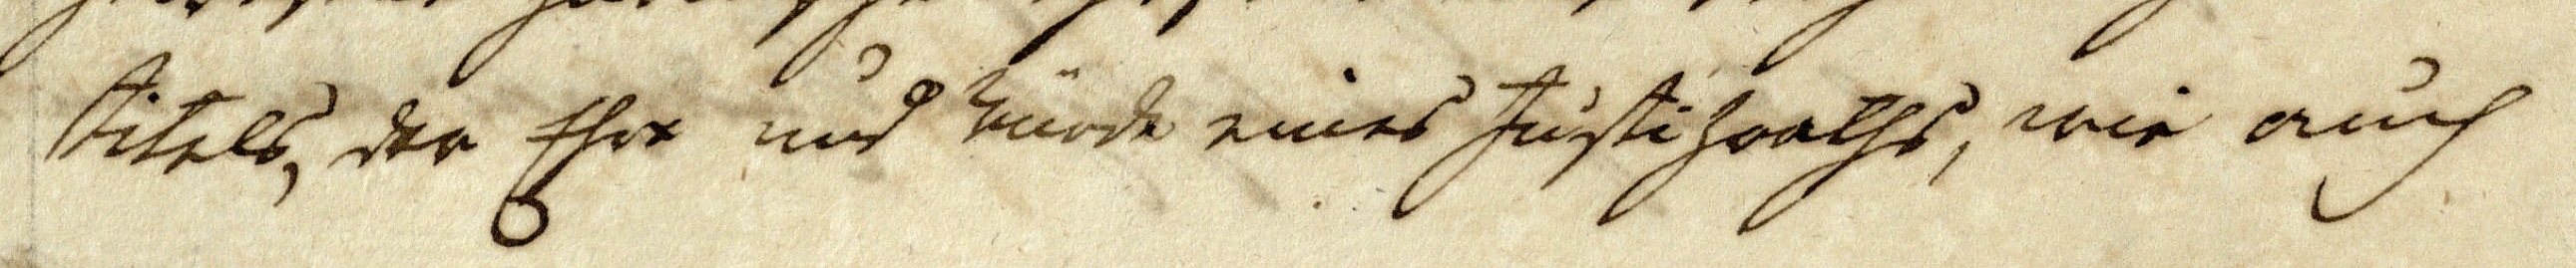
Titels, der Ehre und Würde eines Justizraths, wie auch
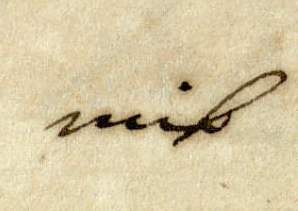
mit
